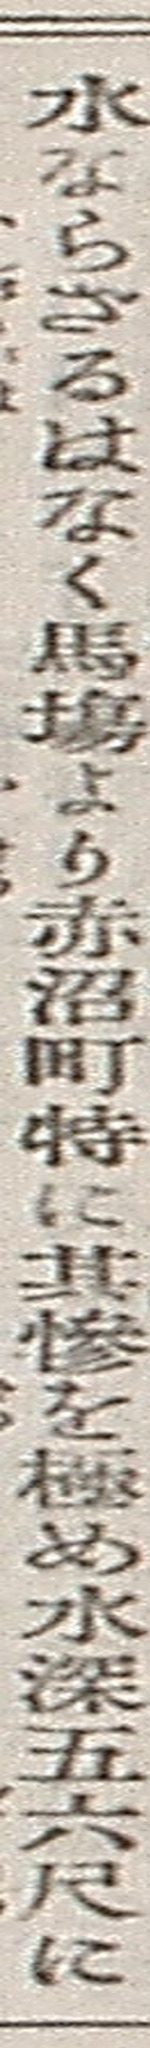水ならざるはなく馬場より赤沼町特に其惨を極め水深五六尺に
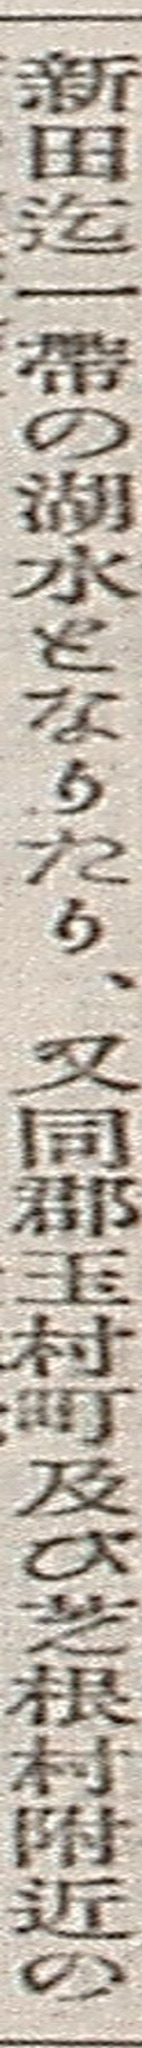新田迄一帯の湖水となりたり、又同郡玉村町及び芝根村附近の
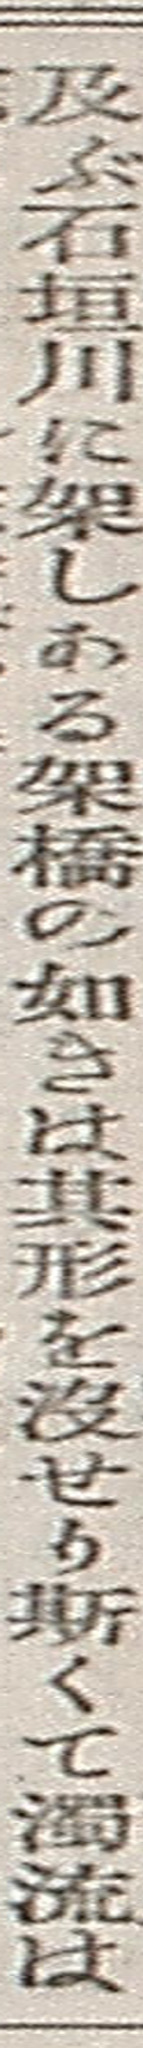及ぶ石垣川に架しある架橋の如きは其形を没せり斯くて濁流は
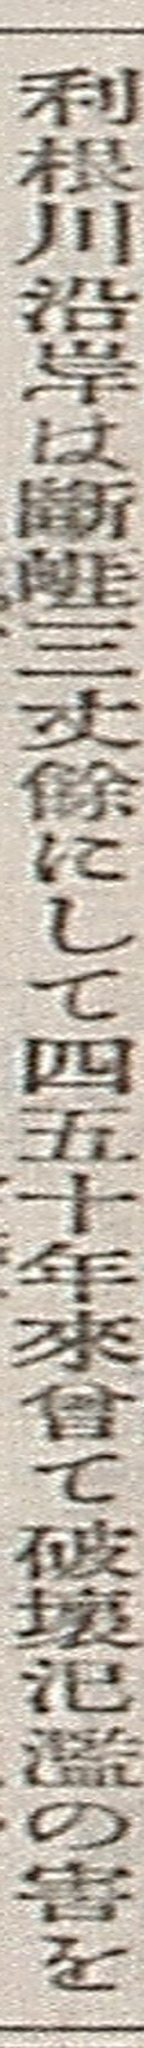利根川沿岸は断崕三丈餘にして四五十年來曾て破壊氾濫の害を
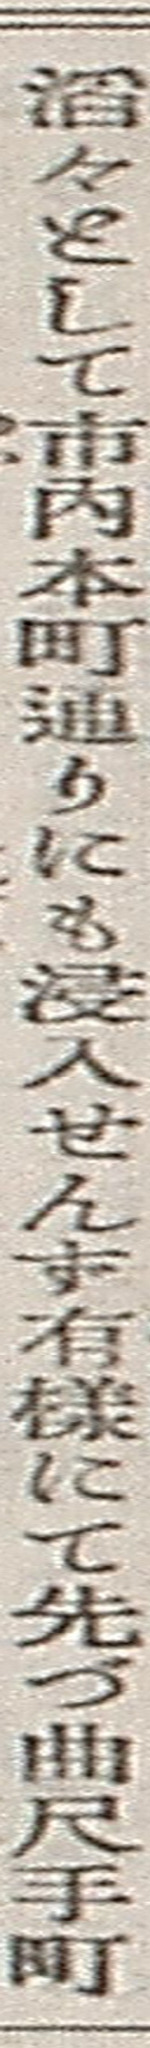滔々として市内本町通りにも侵入せんず有様にて先づ曲尺手町
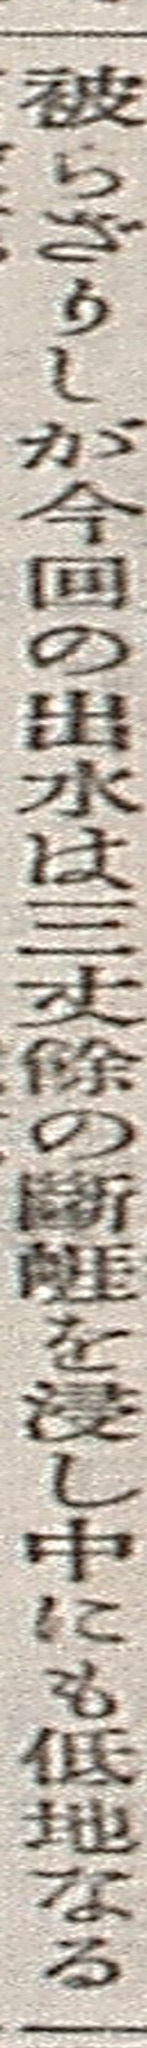被らざりしが今回の出水は三丈餘の断崕を浸し中にも低地なる
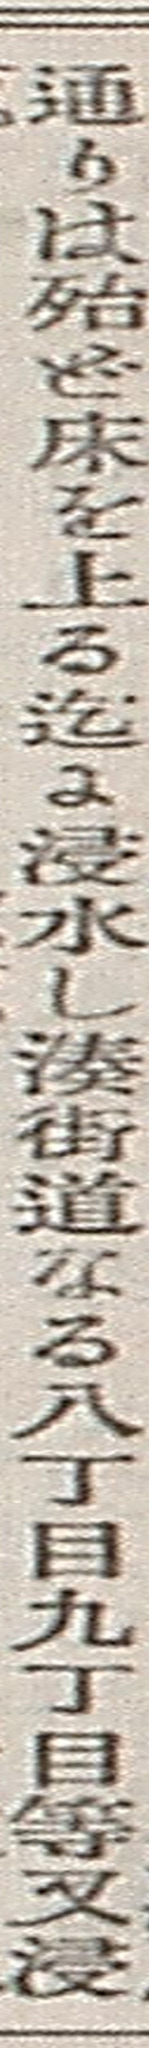通りは殆ど床を上る迄に浸水し湊街道なる八丁目九丁目等又浸
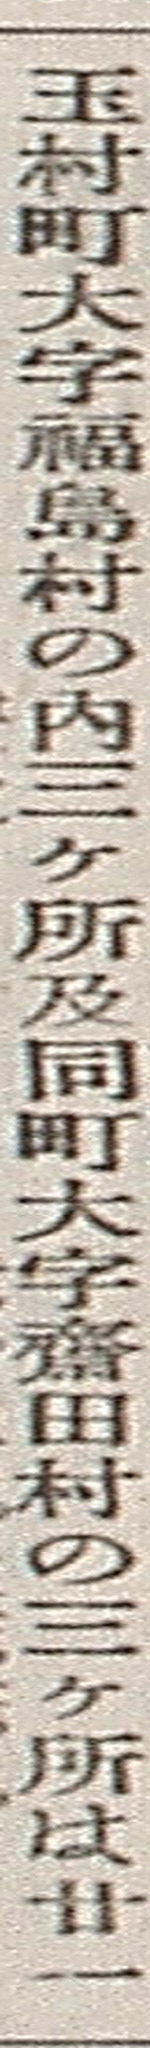玉村町大字福島村の内三ヶ所及同町大字斉田村の三ヶ所は廿一
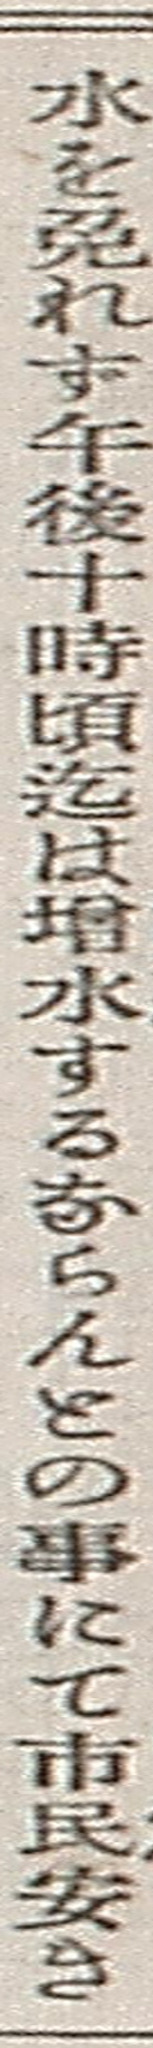水を免れず午後十時頃迄は増水するならんとの事にて市民安き
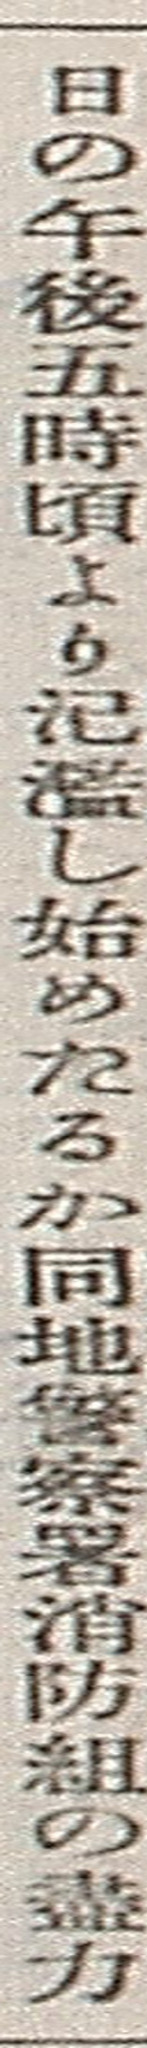日の午後五時頃より氾濫し始めたるか同地警察署消防組の尽力

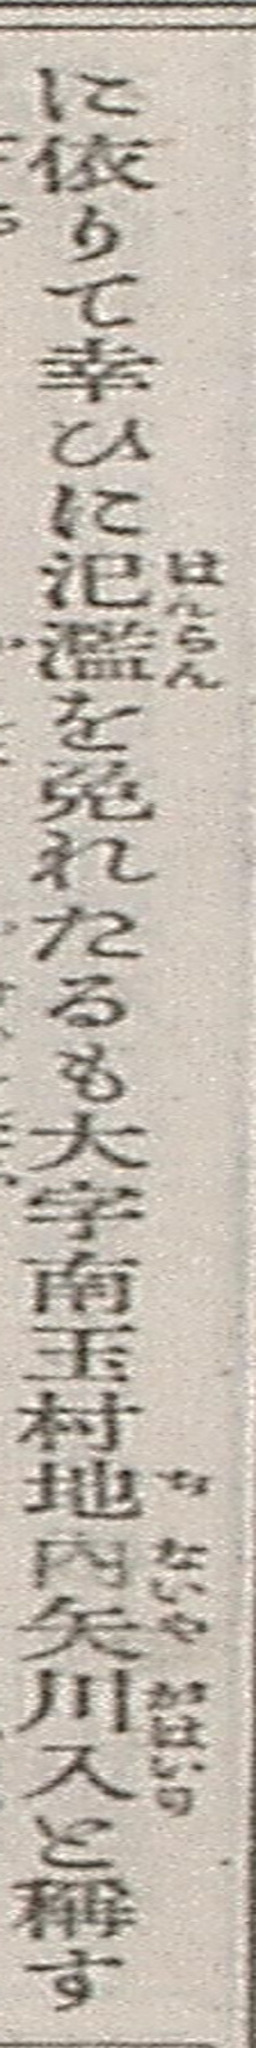に依りて幸ひに氾濫を免れたるも大字南玉村地内矢川入と称す
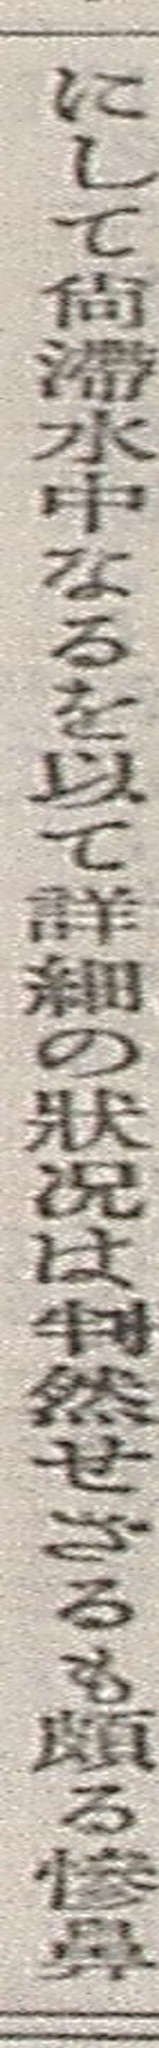にして尚滞水中なるを以て詳細の状況は判然せざるも頗る酸鼻
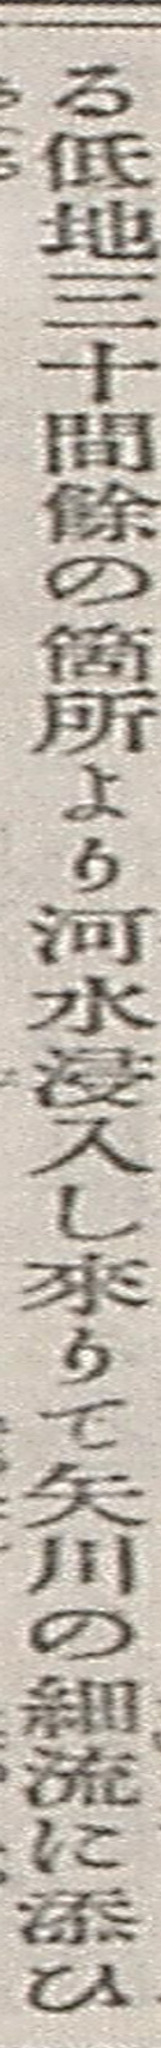る低地三十間餘の箇所より河水侵入し来りて矢川の細流に添ひ
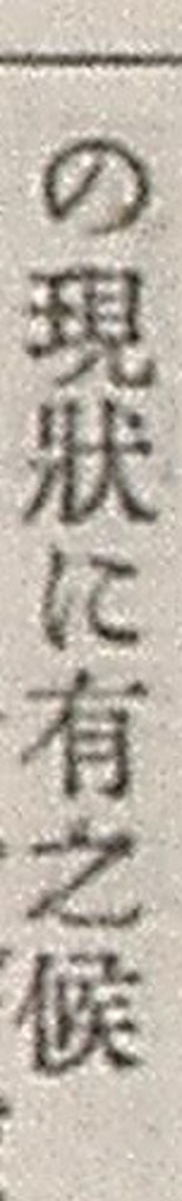の現状に有之候
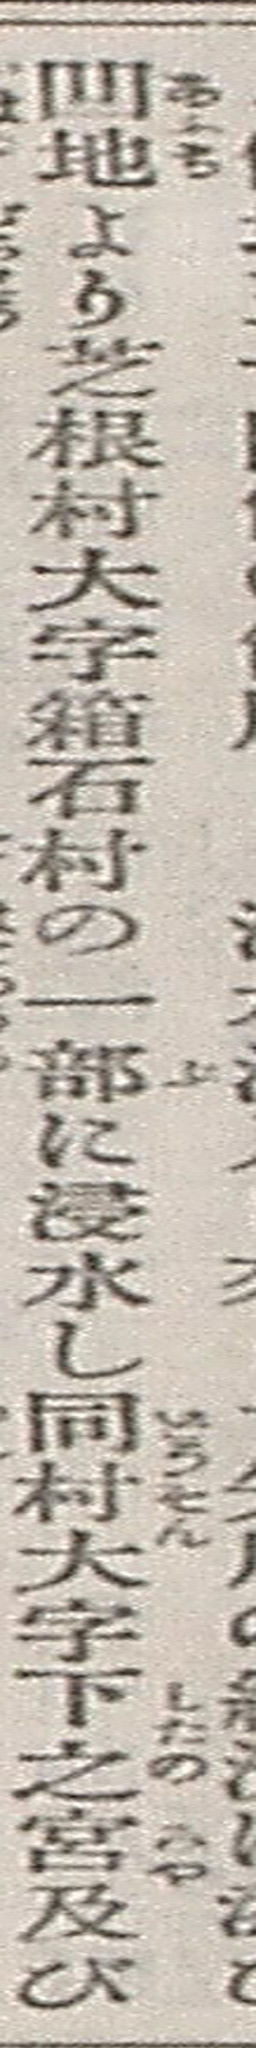凹地より芝根村大字箱石村の一部に浸水し同村大字下之宮及び
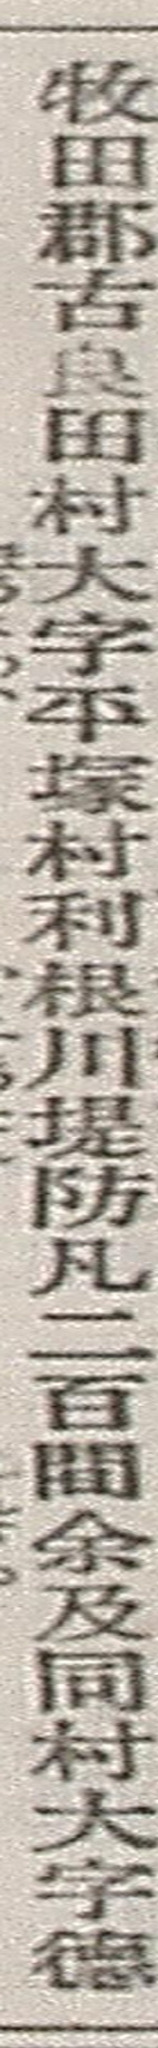牧田郡古良田村大字平塚村利根川堤防凡二百間余及同村大字徳
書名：風俗畫報臨時増刊第百二十八號　洪水被害録（下）
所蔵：東京大学地震研究所図書室 Earthquake Research Institute Library, The University of Tokyo, JAPAN
